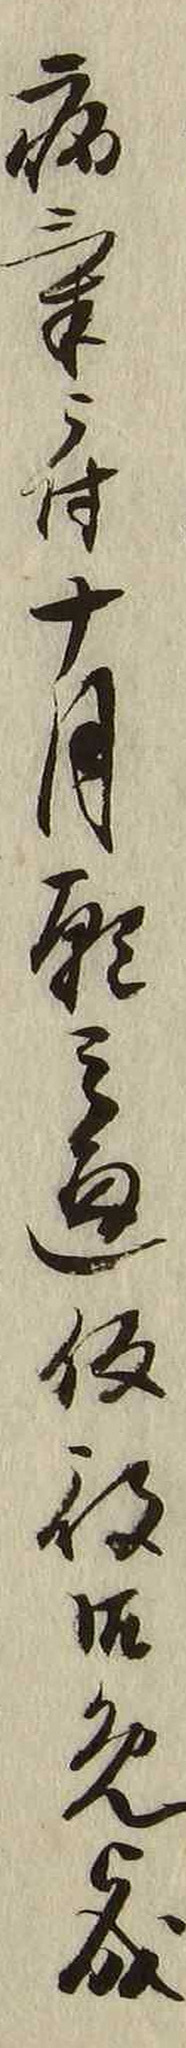病気ニ付十月願之通仮役御免被成
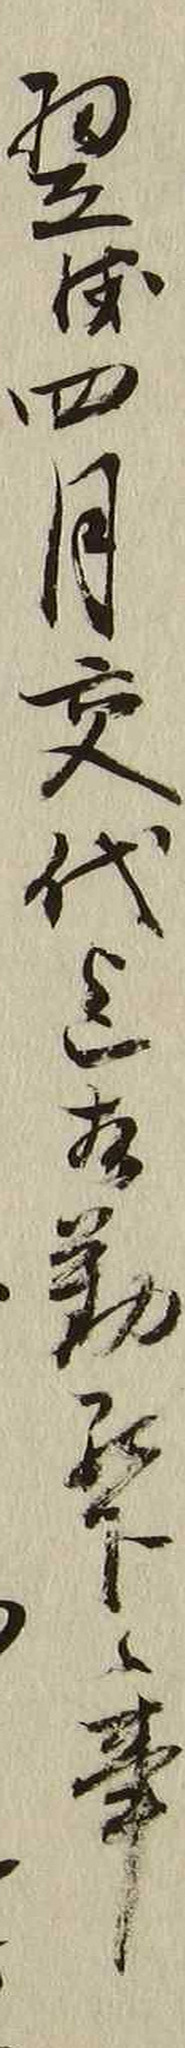翌戌四月交代迄相勤罷下候事
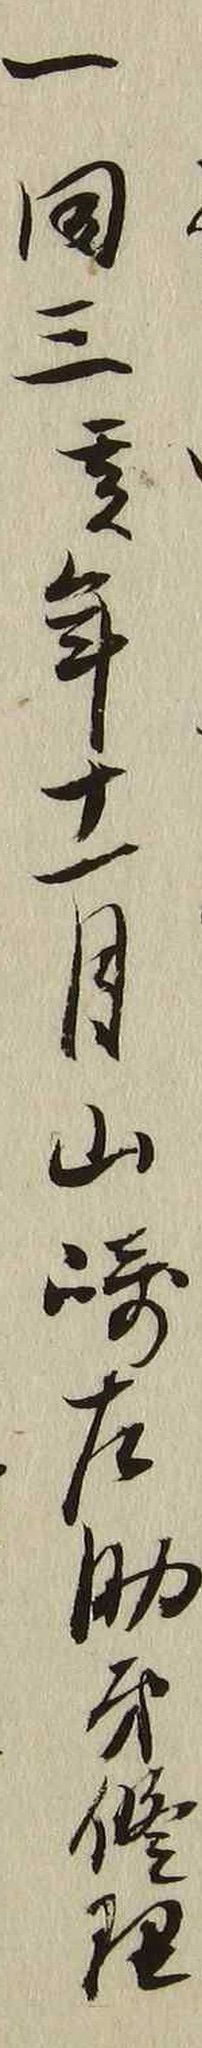一同三亥年十一月山崎左助弟修理
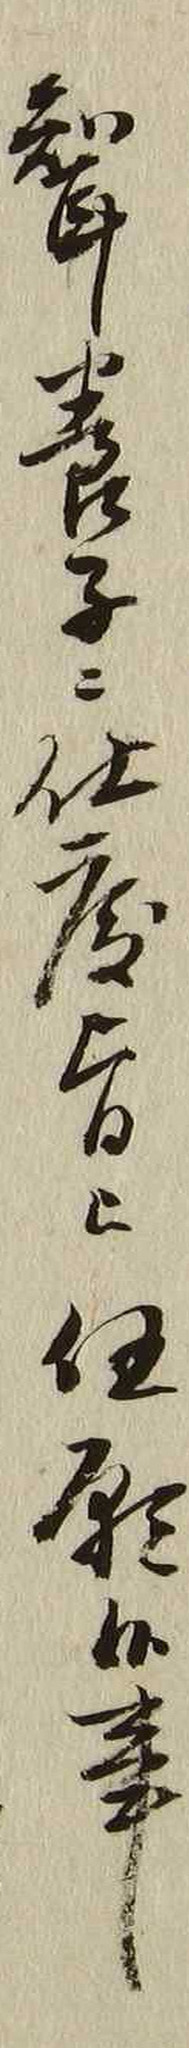婿養子ニ仕度旨被任願候事
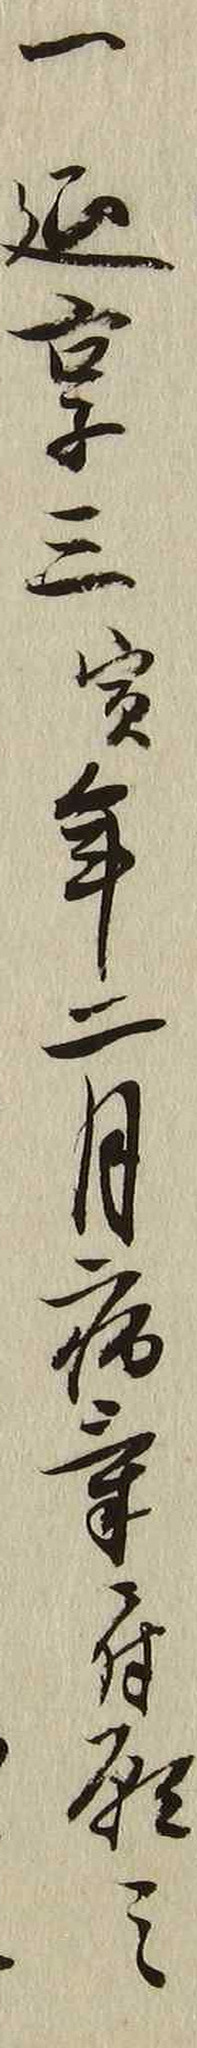一延享三寅年二月病気ニ付願之
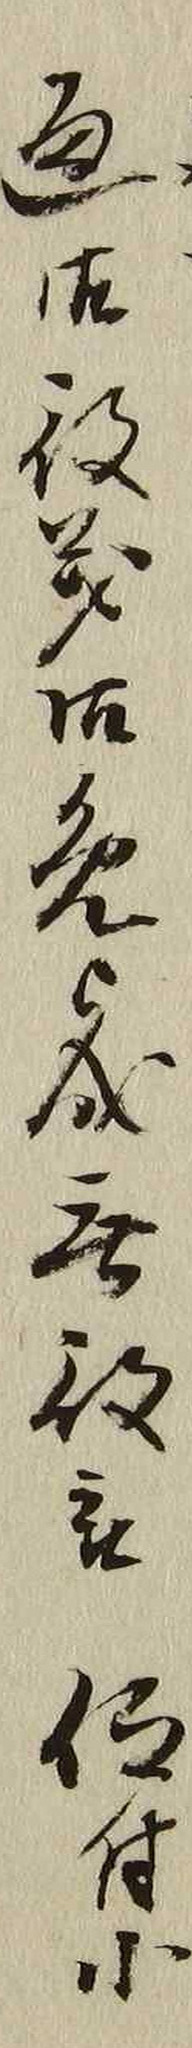通御役義御免被成無役被仰付小
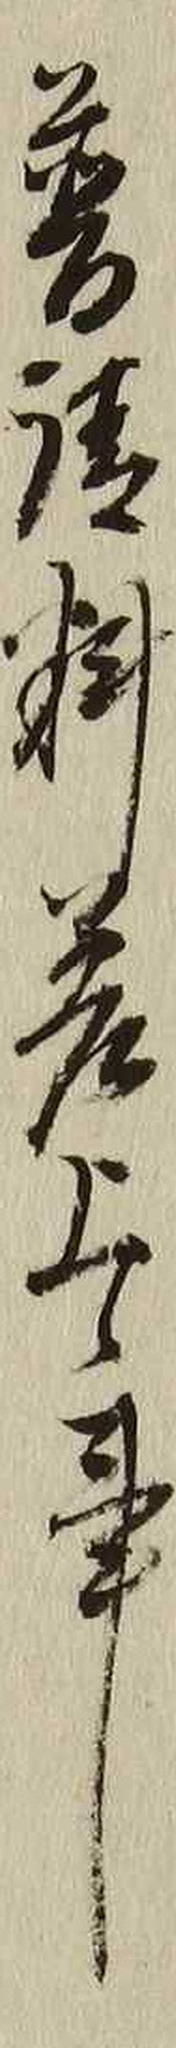普請料差上候事
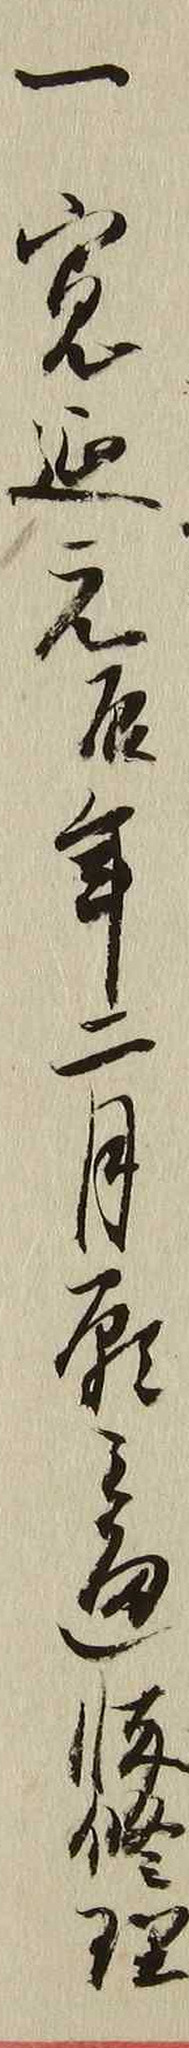一寛延元辰年二月願之通忰修理
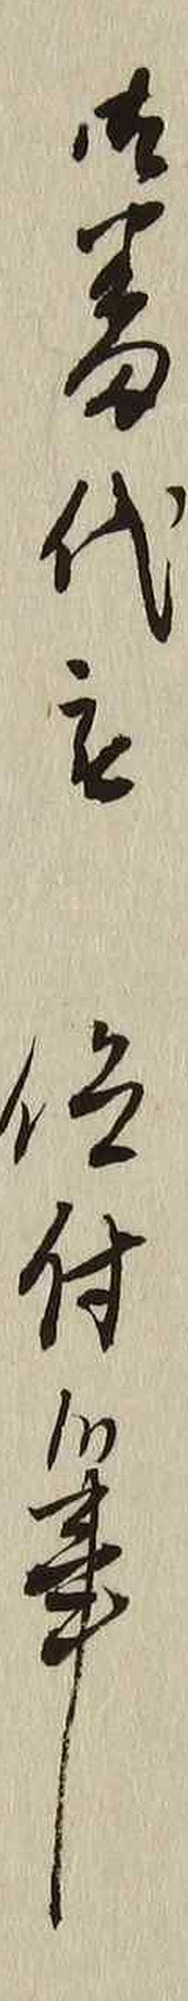御番代被仰付候事
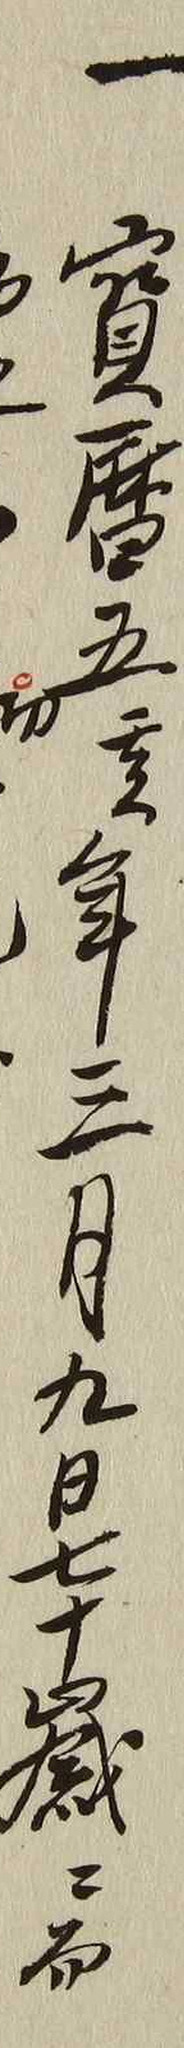一宝暦五亥年三月九日七十歳ニ而
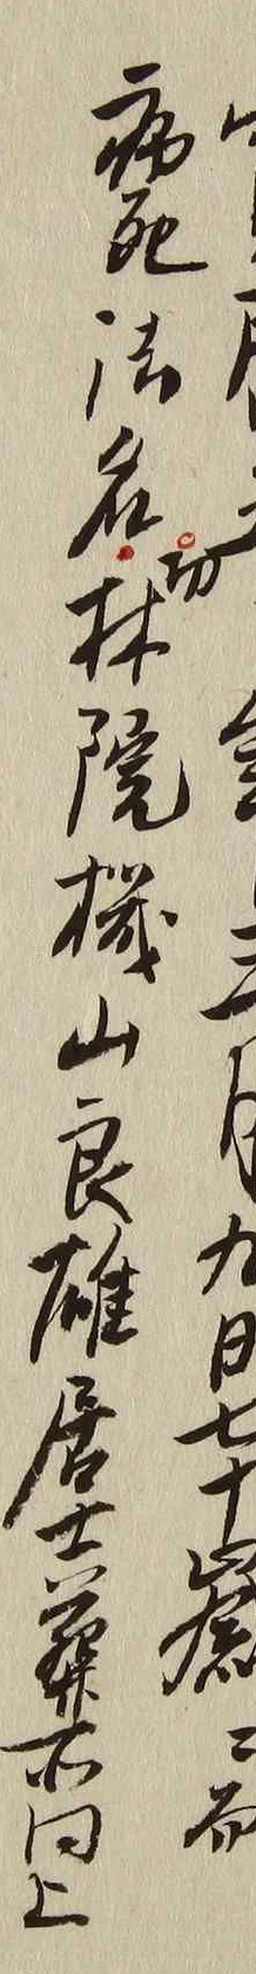病死法名功林院機山良雄居士葬所同上
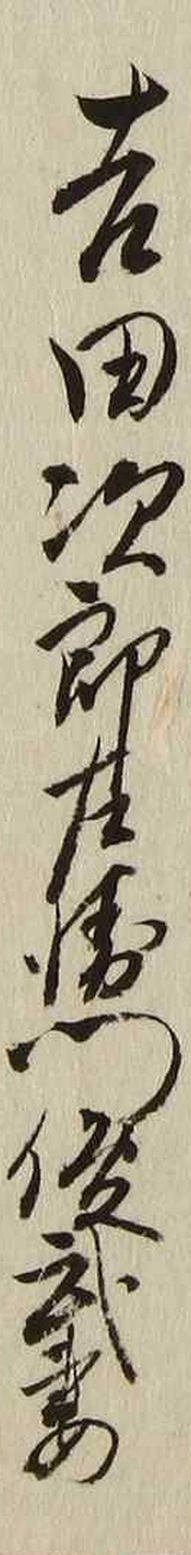女吉田次郎左衛門俊武妻
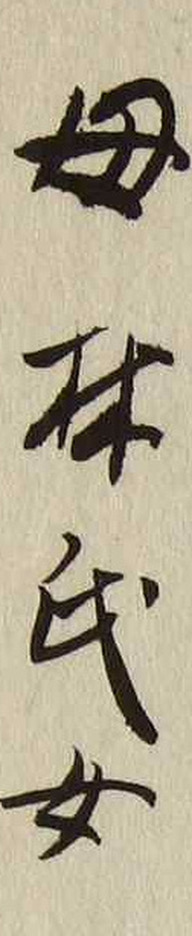母林氏女
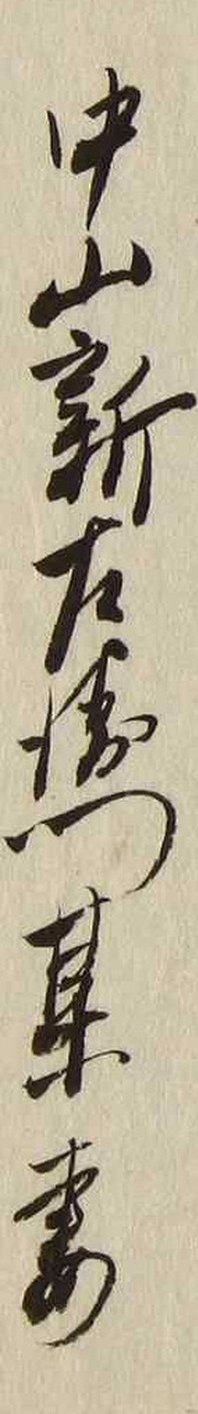女中山新左衛門某妻

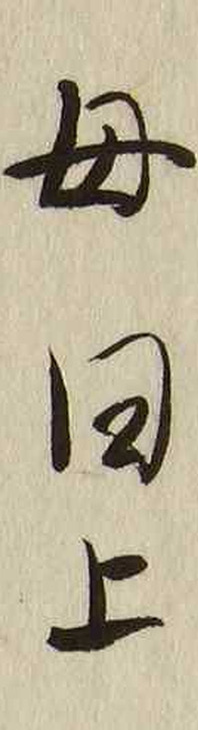母同上
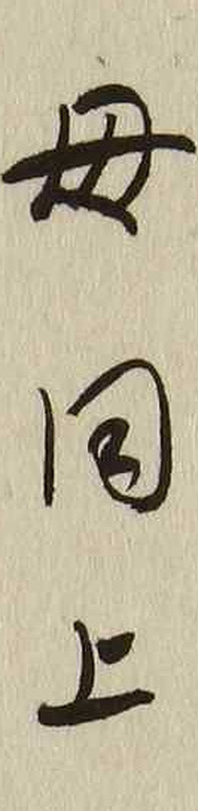母同上
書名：諸士系譜　巻之348　も之部4
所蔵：会津若松市立会津図書館
